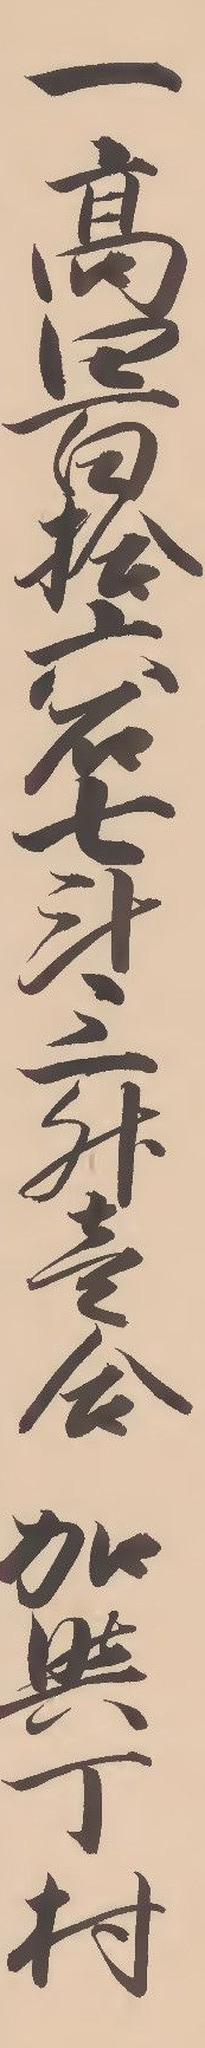一高四百拾六石七斗三升壱合加與丁村
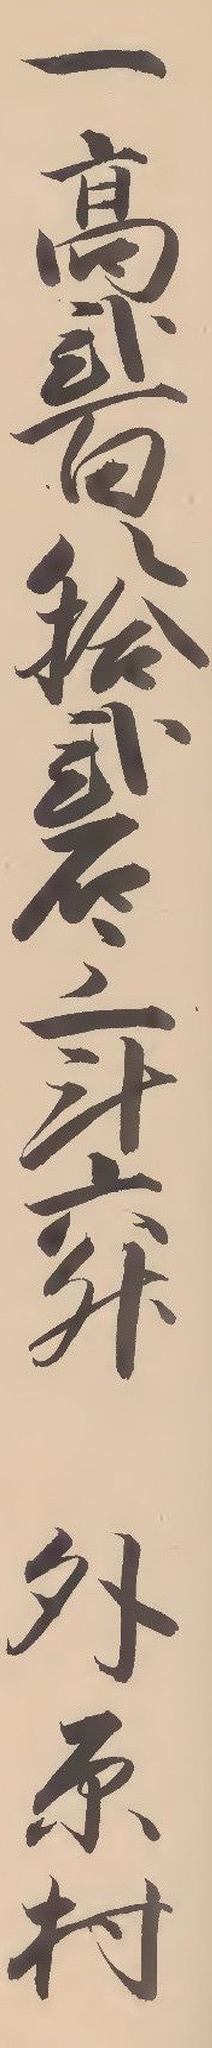一高弐百八拾弐石三斗六升外原村
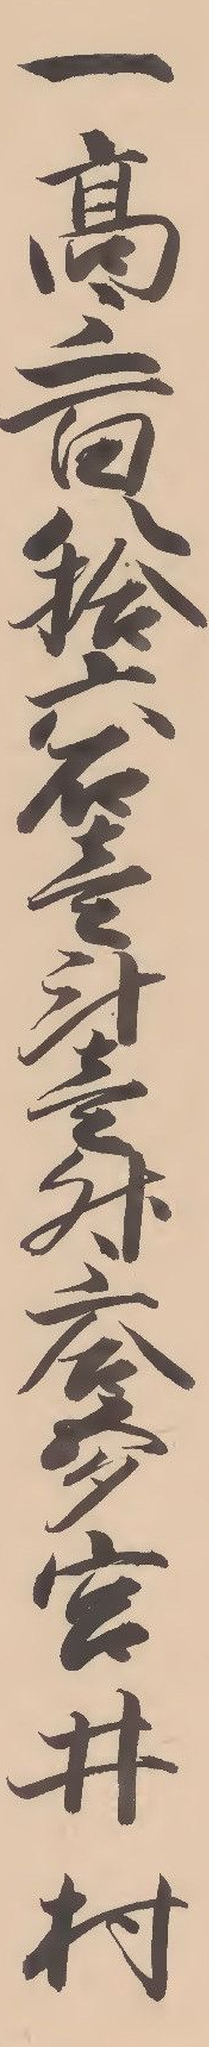一高三百八拾六石壱斗壱升三合五勺宮井村
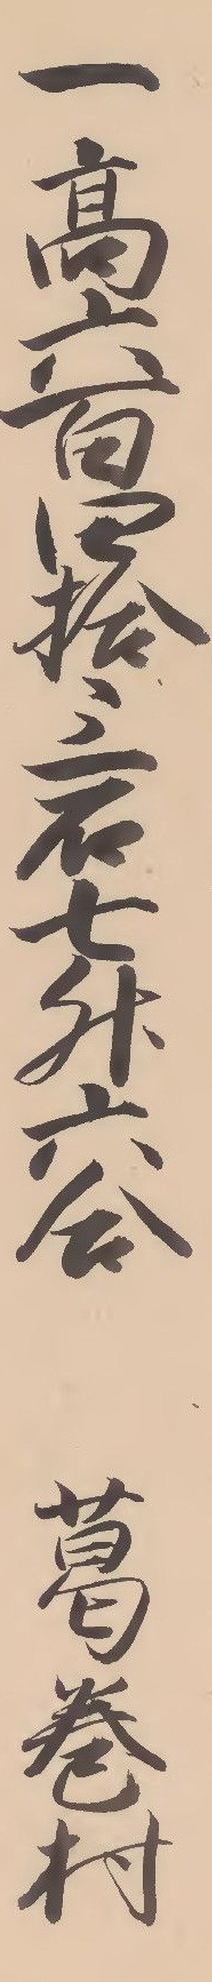一高六百四拾三石七升六合葛巻村
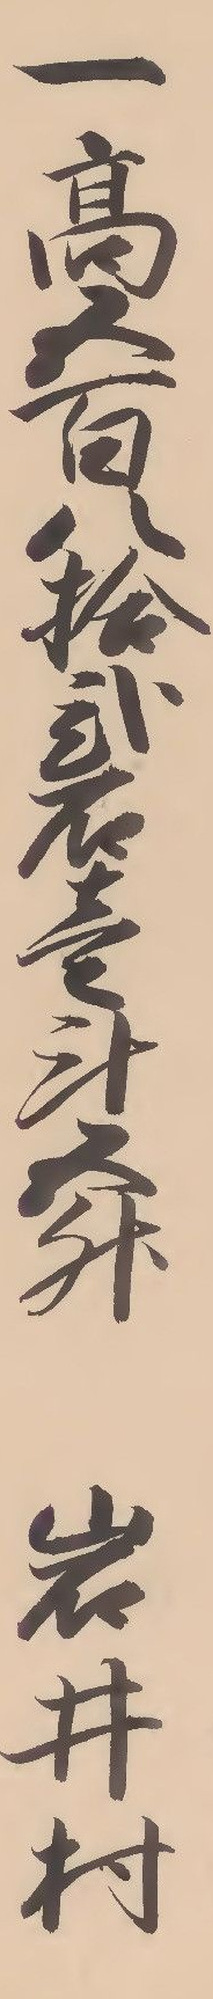一高五百八拾弐石壱斗五升岩井村

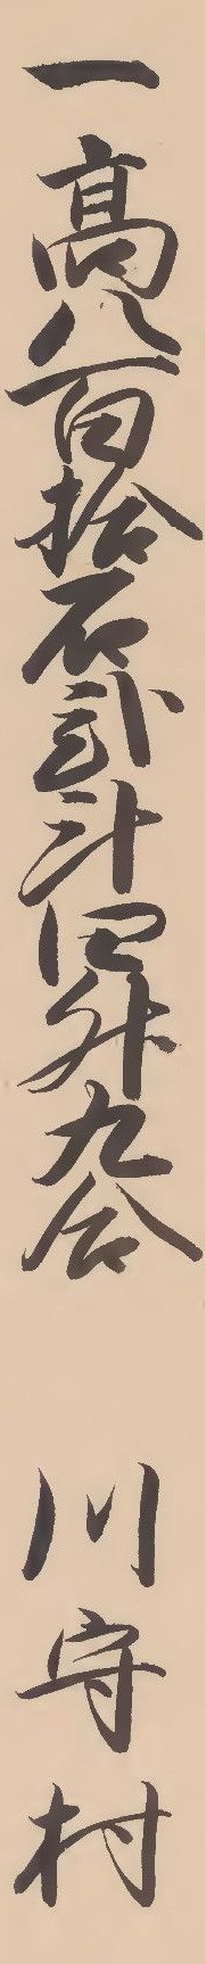一高八百拾石弐斗四升九合川守村
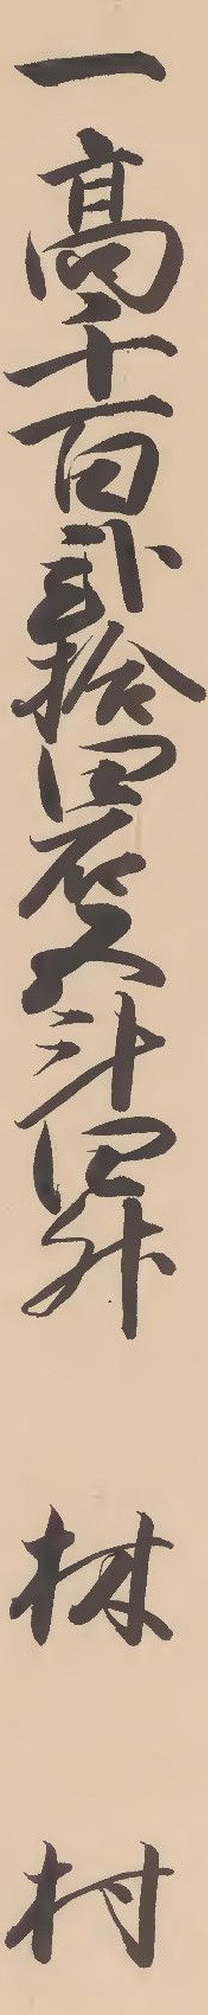一高千百弐拾四石五斗四升林村
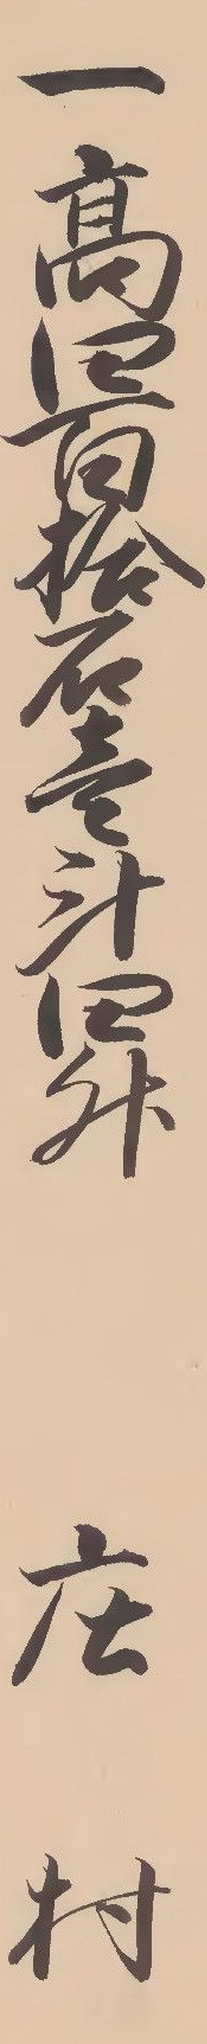一高四百拾石壱斗四升庄村
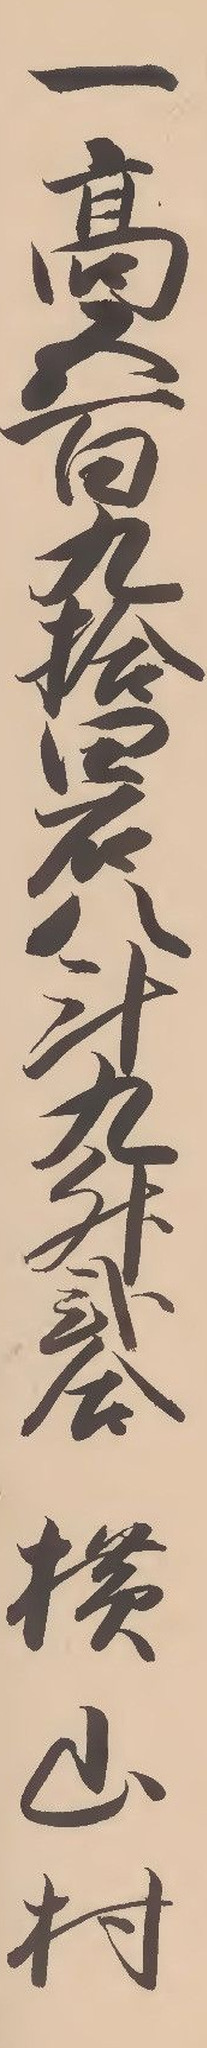一高五百九拾四石八斗九升弐合横山村
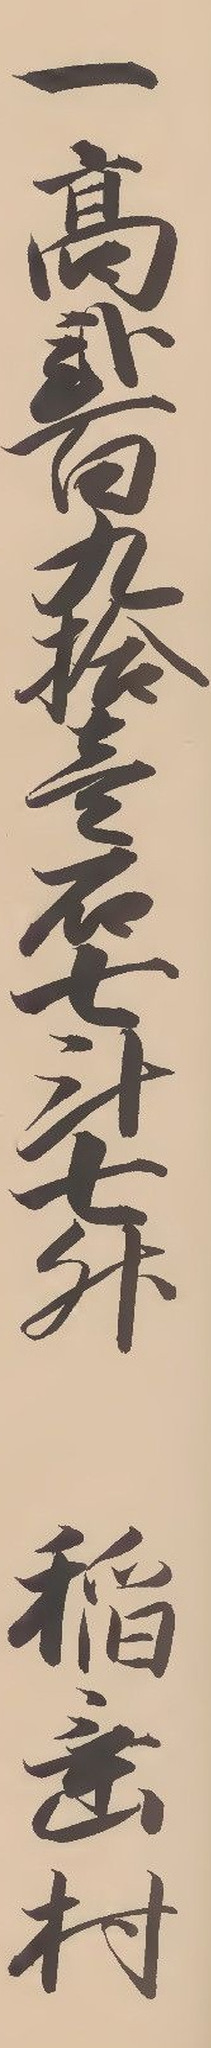一高弐百九拾壱石七斗七升稲垂村
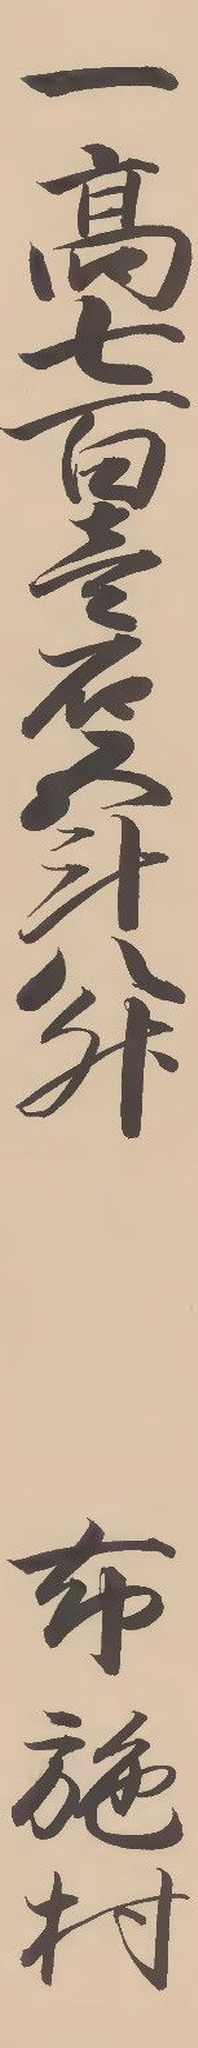一高七百壱石五斗八升布施村
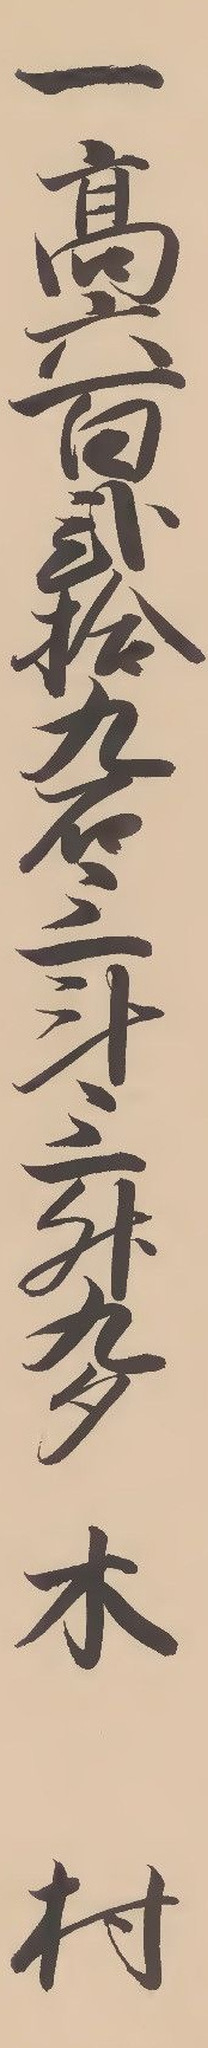一高六百弐拾九石三斗三升九勺木村
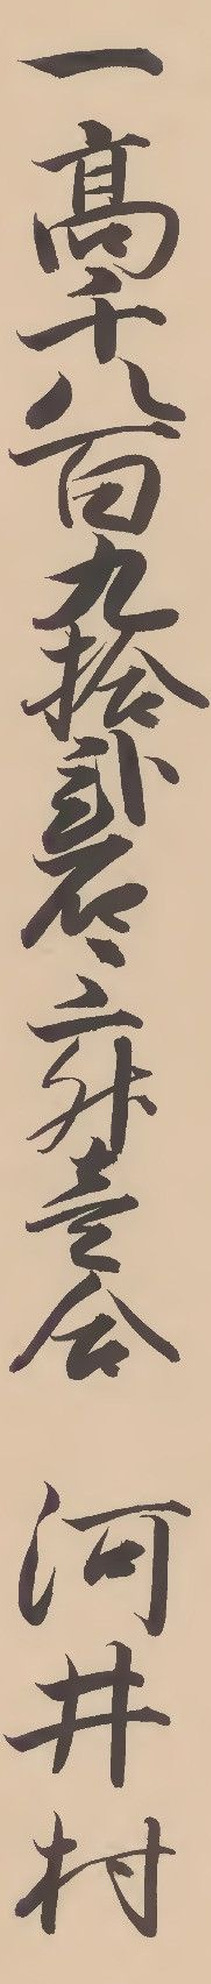一高千八百九拾弐石三升壱合河井村

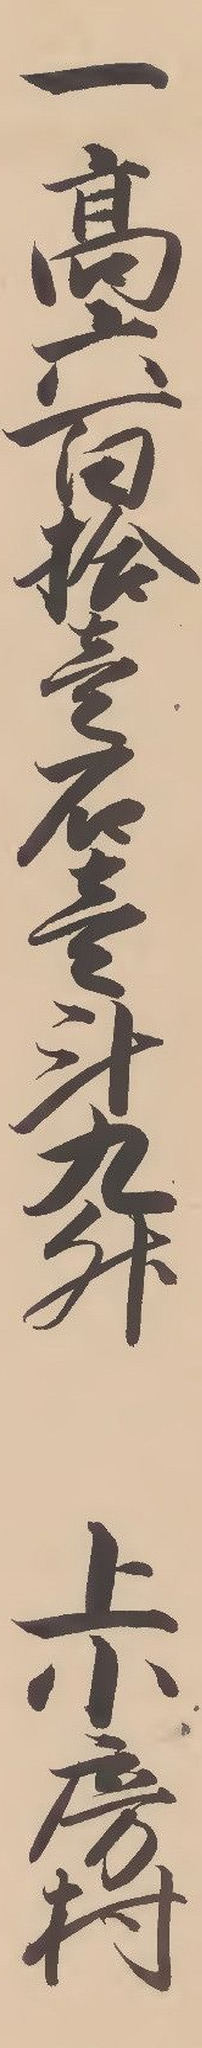一高六百拾壱石壱斗九升上小房村
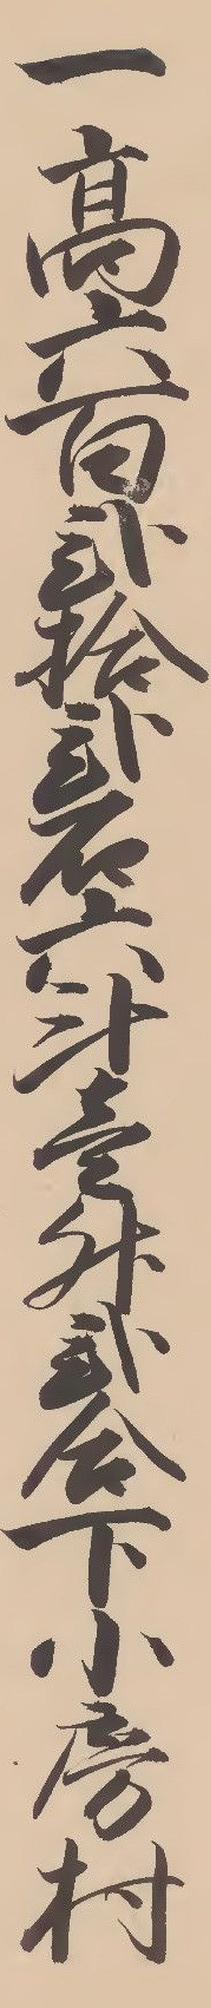一高六百弐拾弐石六斗壱升弐合下小房村
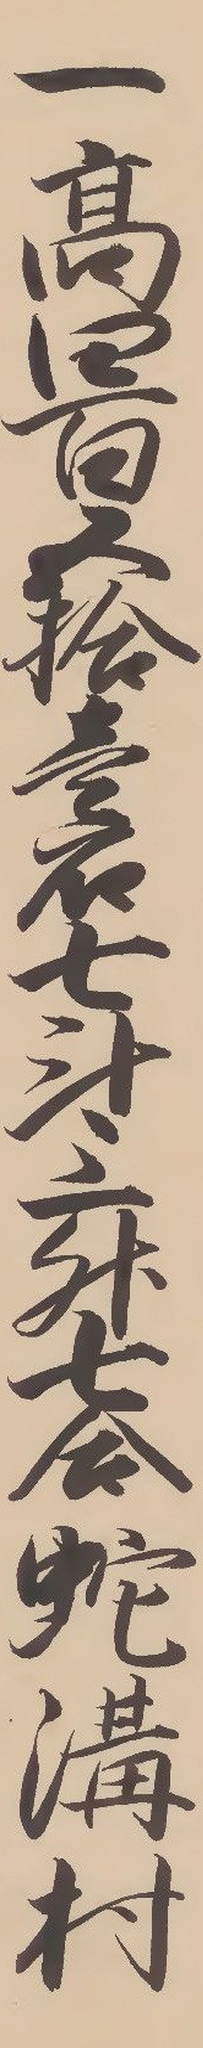一高四百五拾壱石七斗三升七合蛇溝村
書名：近江国郷帳
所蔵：国立公文書館 National Archives of Japan
